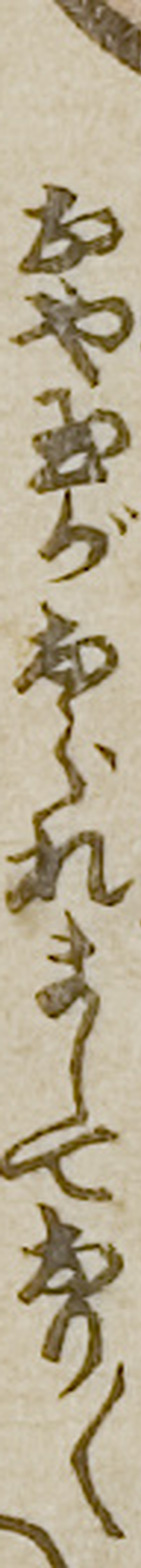おや玉がおられましており〳〵
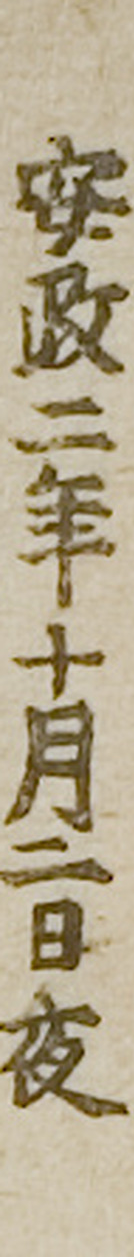安政二年十月二日夜
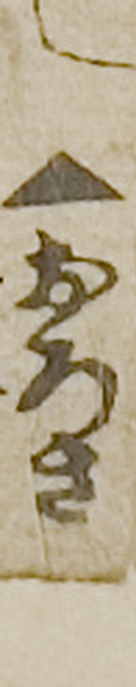おろさ
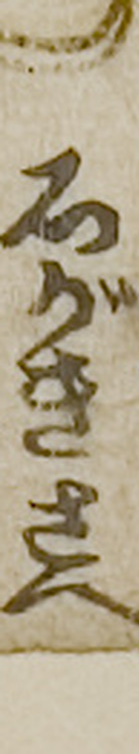石がきさへ
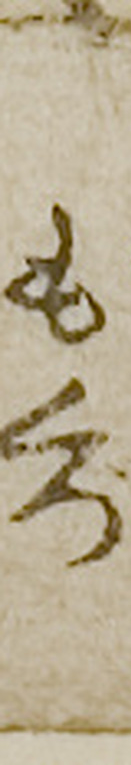もくづ
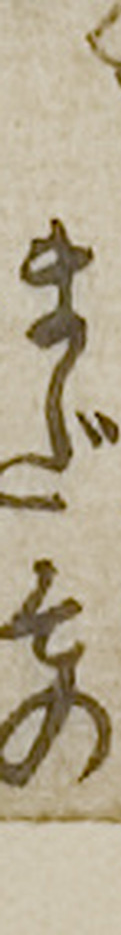まだその
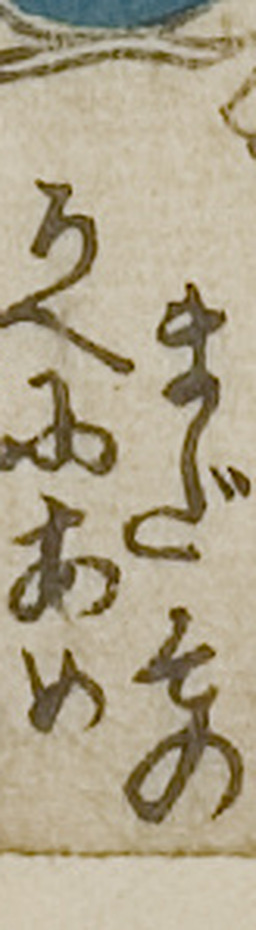うへにあめ
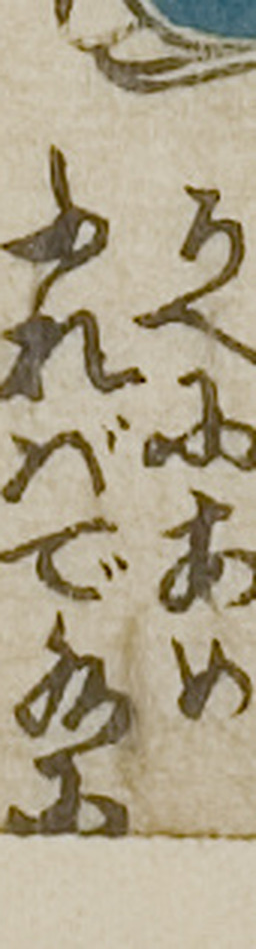ふればで水に
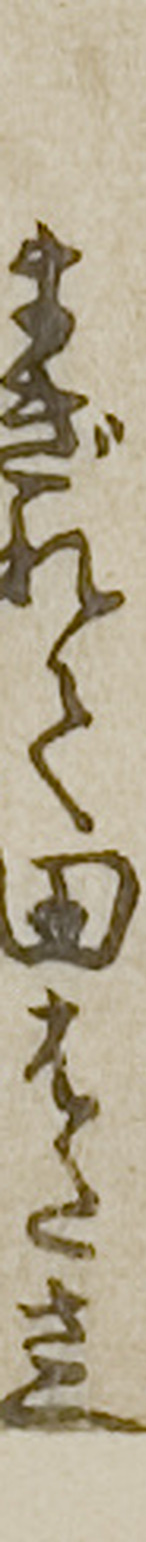まぎれて田はたさへ
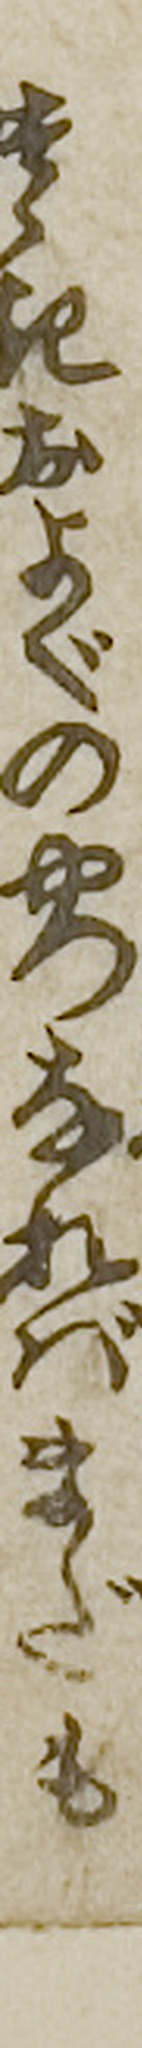つゝきおよぐのやつなればまだも
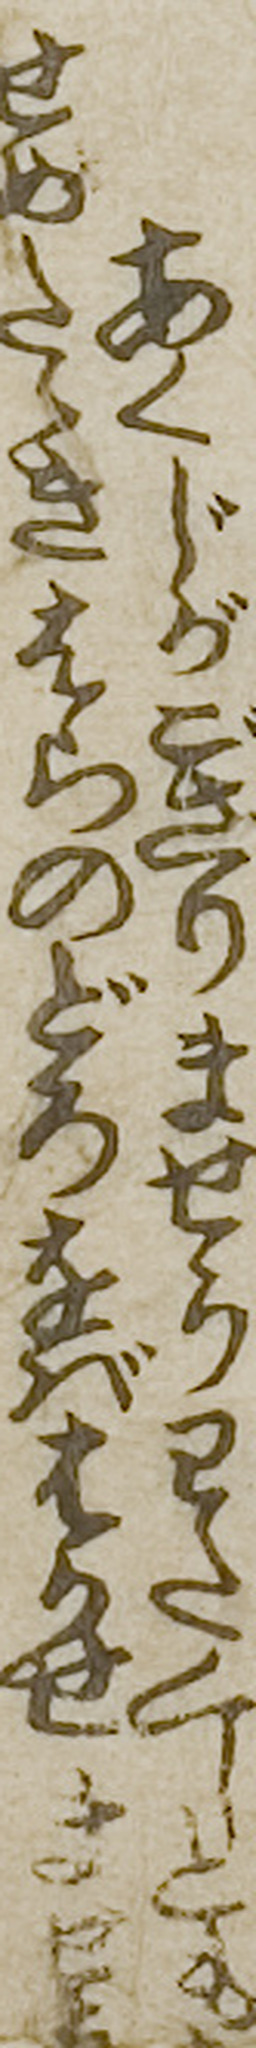せめたゝきはらのどろをばはかせませう
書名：[すい神のおしえにいのちたすかりて]
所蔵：東京大学総合図書館 General Library in the University of Tokyo, JAPAN
